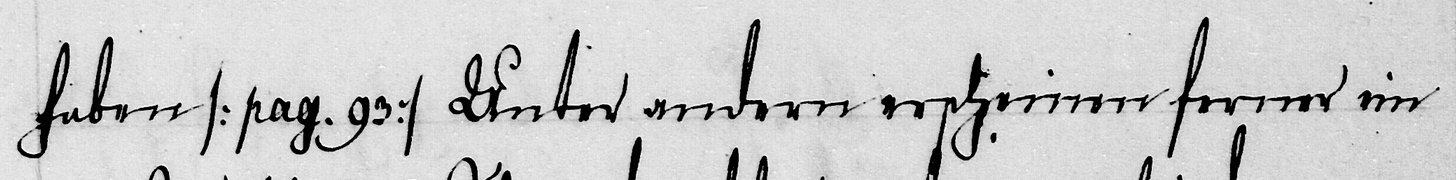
haben [pag. 93.] Unter andern erscheinen ferner ein
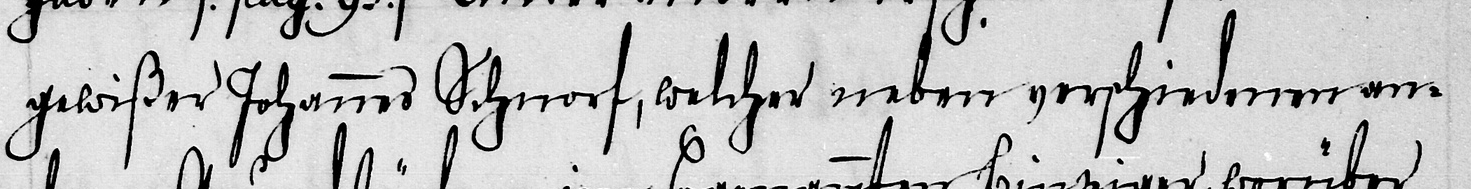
gewißer Johannes Schnorf, welcher neben verschiedenen an¬
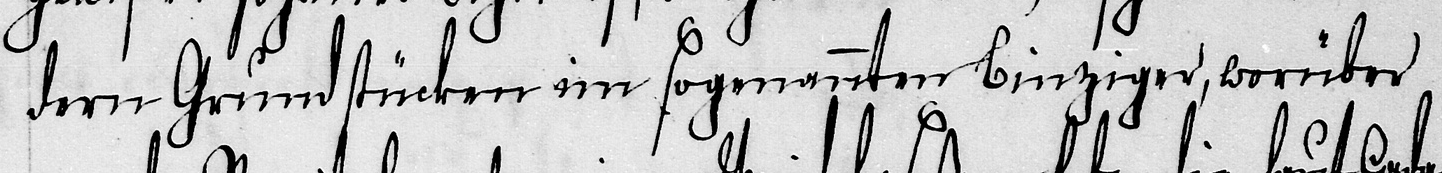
dern Grundstücken im sogenannten Binziger, worüber
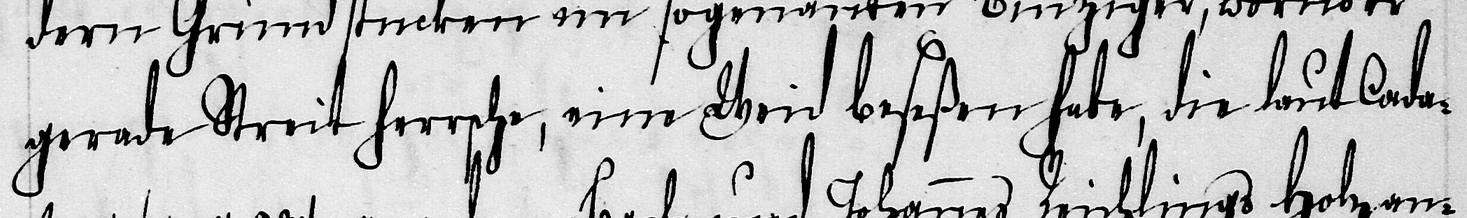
gerade Streit herrsche, eine Weid beseßen habe, die laut Cad¬
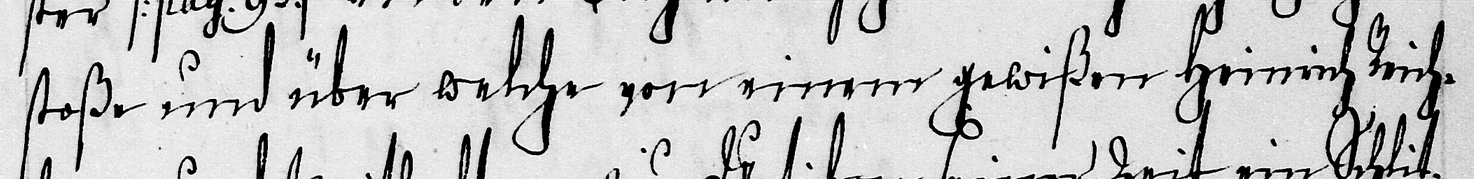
stoße und über welche von einem gewißen Heinrich Reich¬
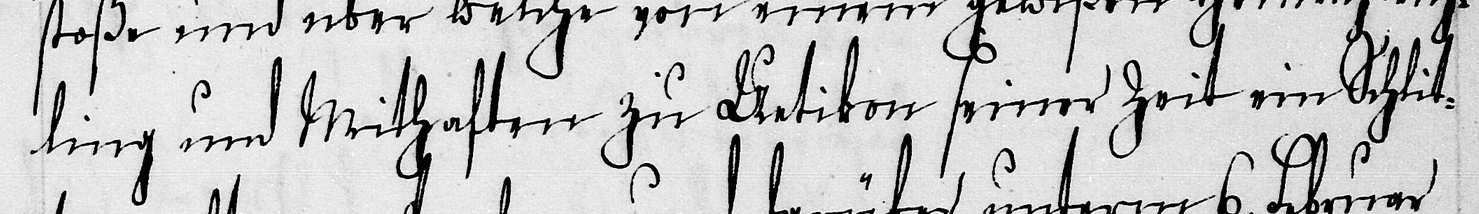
ling und Mithaften zu Uetikon seiner Zeit ein Schlit¬
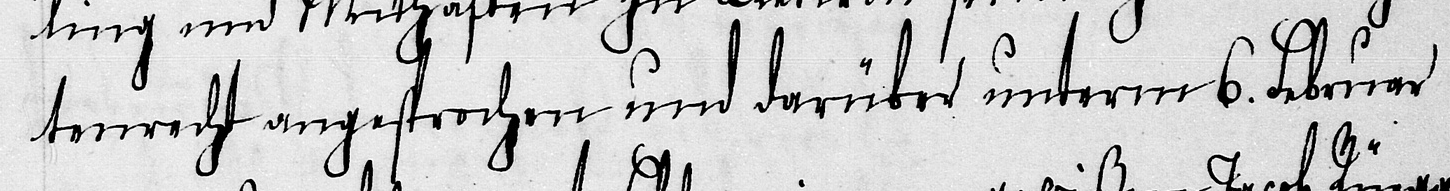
tenrecht angesprochen und darüber unterm 6. Februar
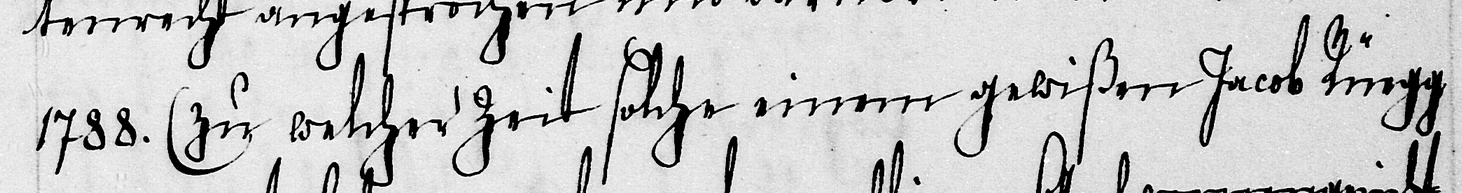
1788. (zu welcher Zeit solche einem gewißen Jacob Rüegg
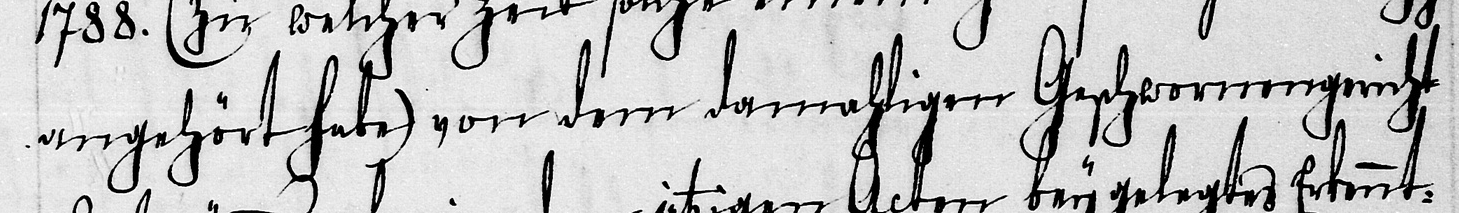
angehört habe) von dem damahligen Geschwornengericht
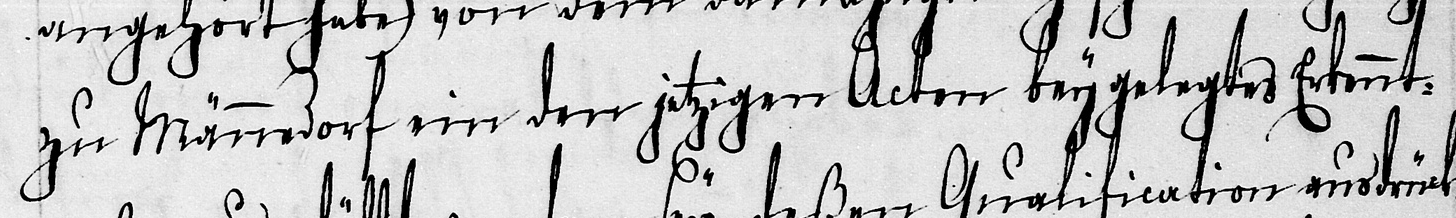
zu Männedorf ein den jetzigen Acten beygelegtes Erkennt¬
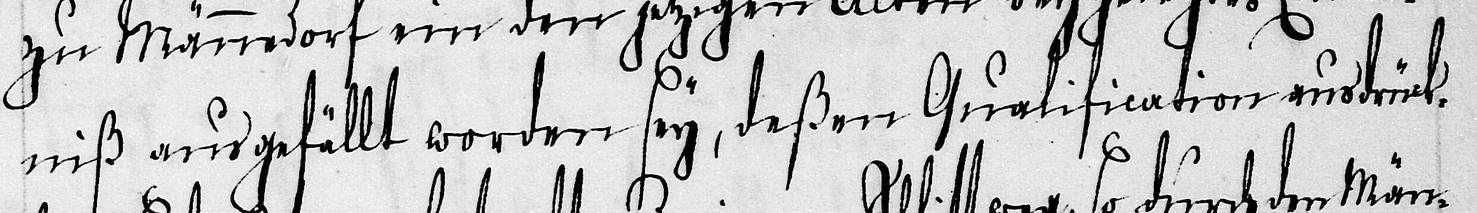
niß ausgefällt worden sey, deßen Qualification ausdrück¬
